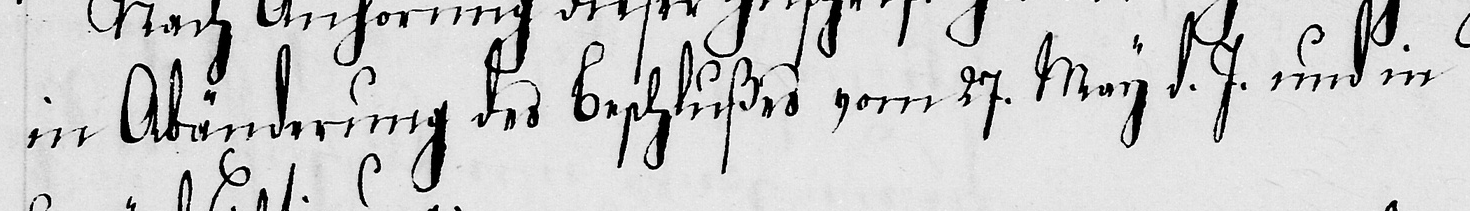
in Abänderung des Beschlußes vom 27. März d. J. und in
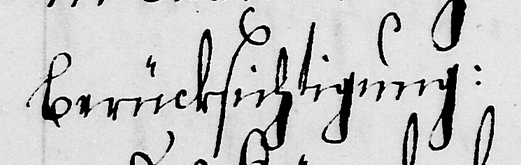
Berücksichtigung:
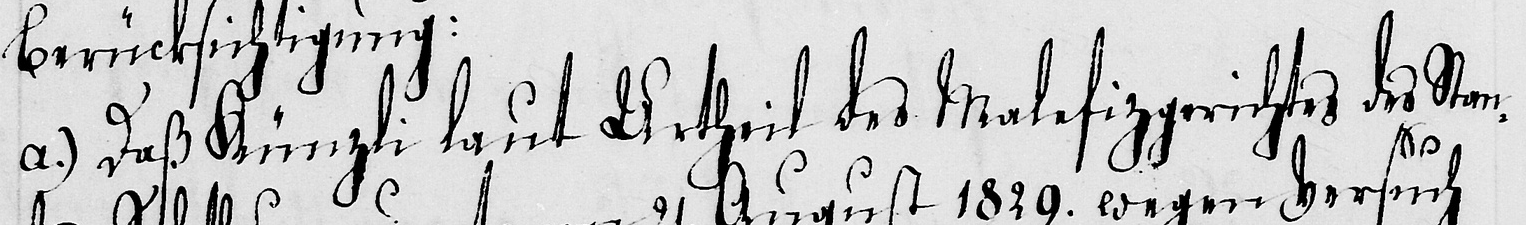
a.) Daß Künzli laut Urtheil des Malefizgerichtes des St¬
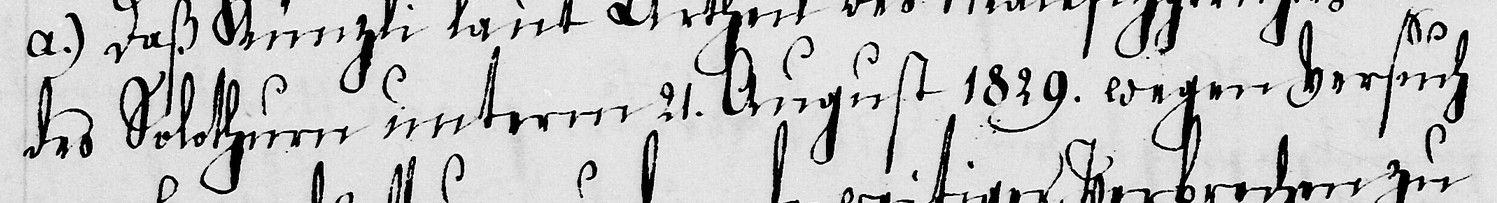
des Solothurn unterm 21. August 1829. wegen Versuch
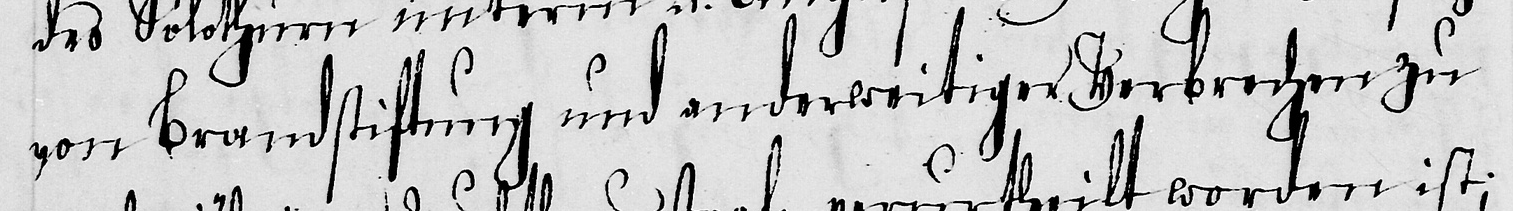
von Brandstiftung und anderweitiger Verbrechen zu
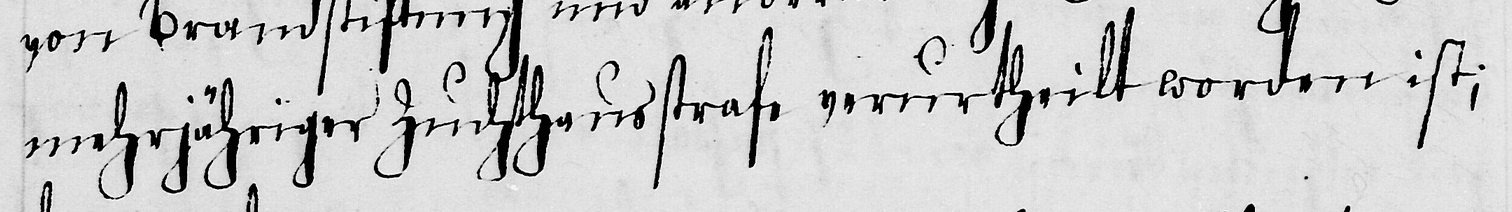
mehrjähriger Zuchthausstrafe verurtheilt worden ist;
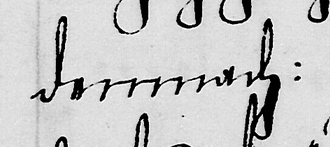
demnach:
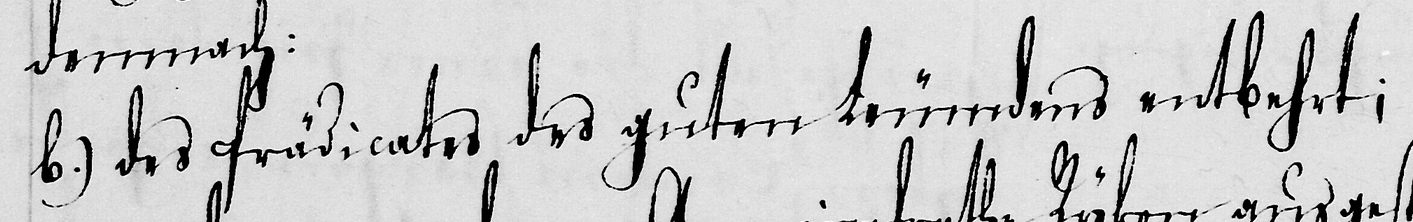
b.) des Prädicates des guten Leumdens entbehrt;
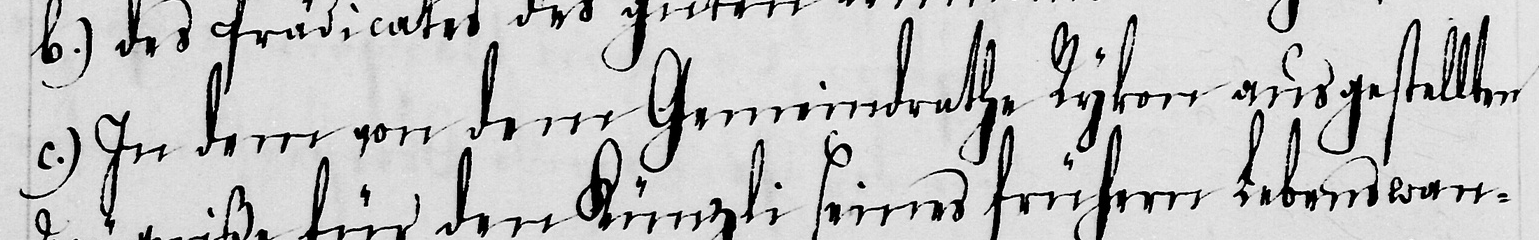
c.) In dem von dem Gemeindrahte Rykon ausgestellten
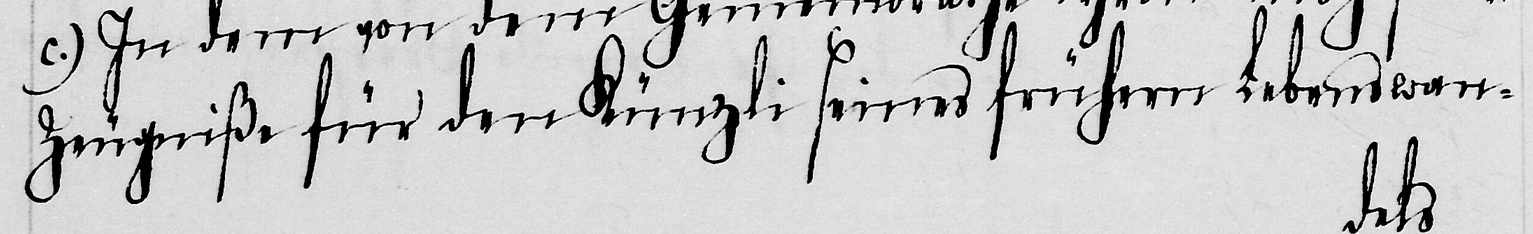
Zeugniße für den Künzli seines frühern Lebenswan-
